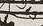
meinen
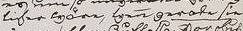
mich sein müsse würde, weil gerade diejenigen,
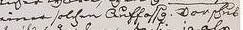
einer solchen Auffassg. Vorschub
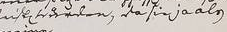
leisten würden, da sie ja als
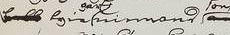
halb, wie gar niemand anders, sonst in
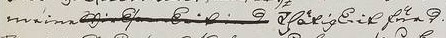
meine Wirksamkeit und Thätigkeit für d.
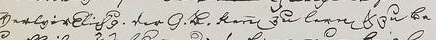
Verwirklichg. der G.B. kennen zu lernen & zu be-
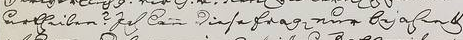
urtheilen? Ich kann diese Fragen nur bejahen &
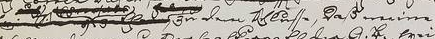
Sie es Ihrerseits gethan haben, zu dem Schlusse, daß meine
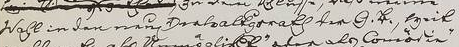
Wahl in den neuen Verwaltungsrath der G.B., weit
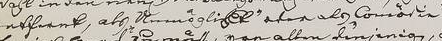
entfernt, als «Unmöglichkt» oder als «Comödie»
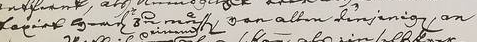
taxirt werden zu müssen, von allen denjenigen, an
